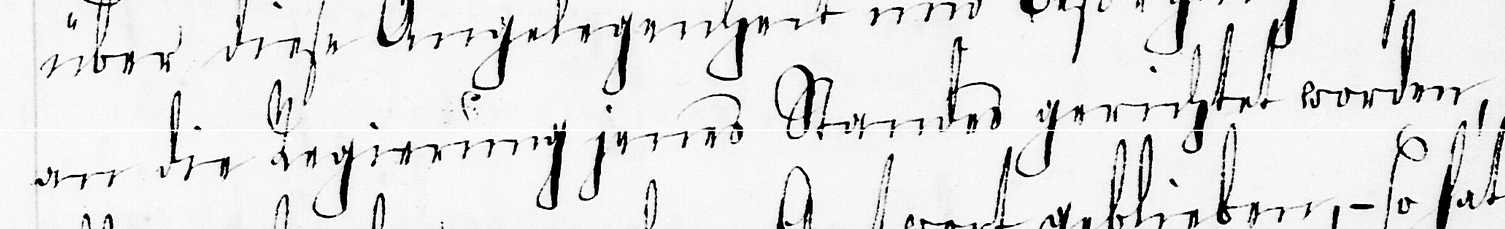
an die Regierung jenes Standes gerichtet worden,
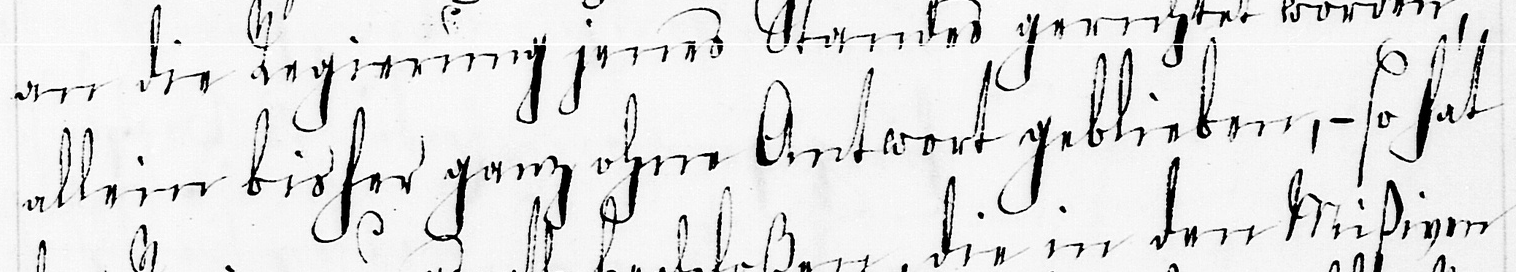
allein bisher ganz ohne Antwort geblieben, – so hat
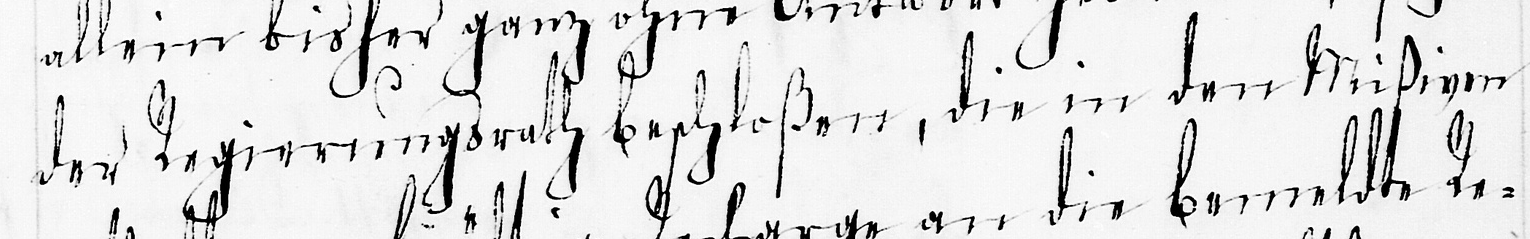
der Regierungsrath beschloßen, die in den Mißiven
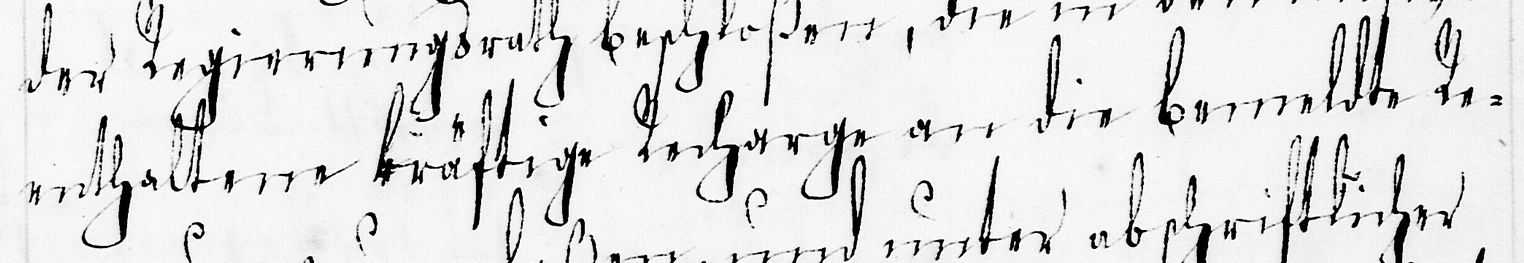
enthaltene kräftige Recharge an die bemeldte Re¬
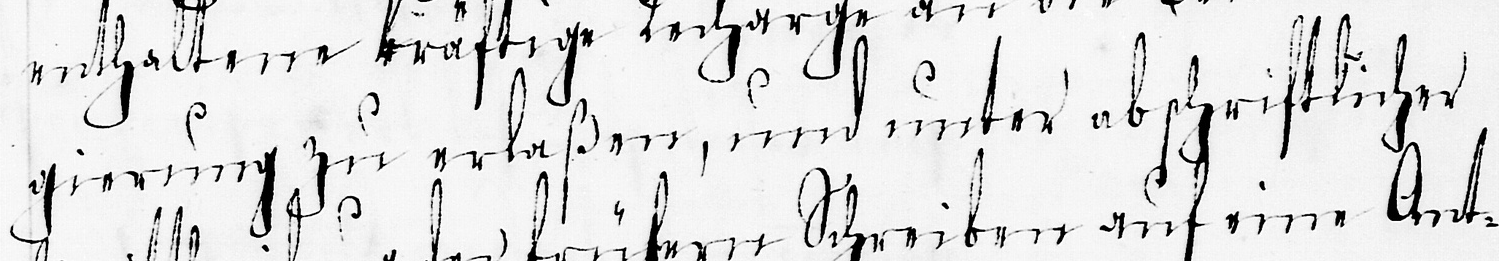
gierung zu erlaßen, und unter abschriftlicher
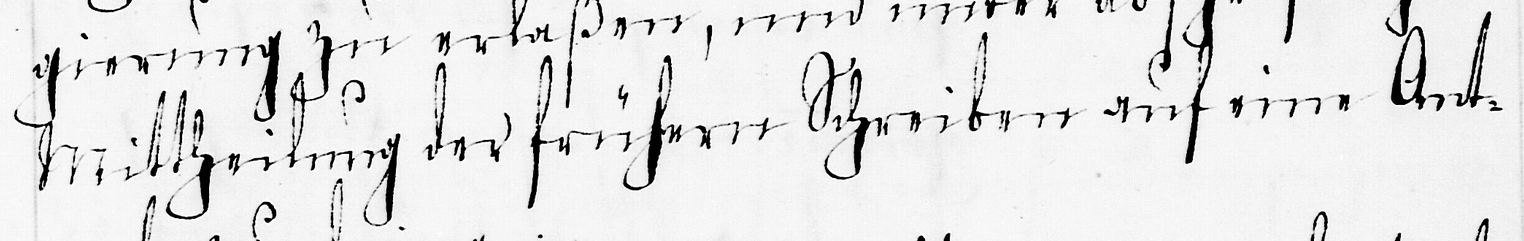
Mittheilung der frühern Schreiben auf eine Ant¬
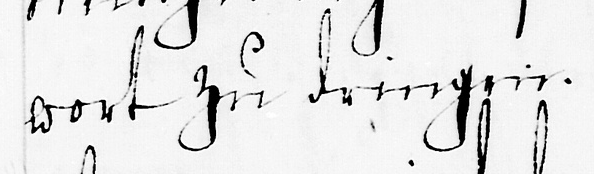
wort zu dringen.
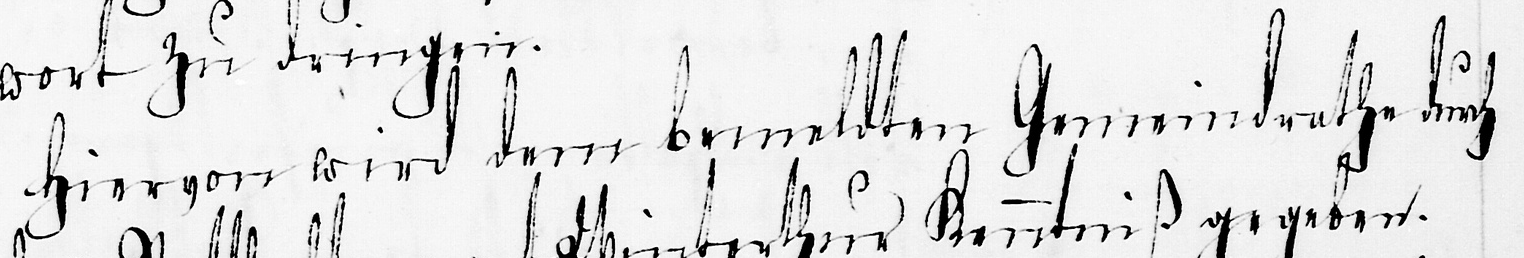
Hiervon wird dem bemeldten Gemeindrathe du¬
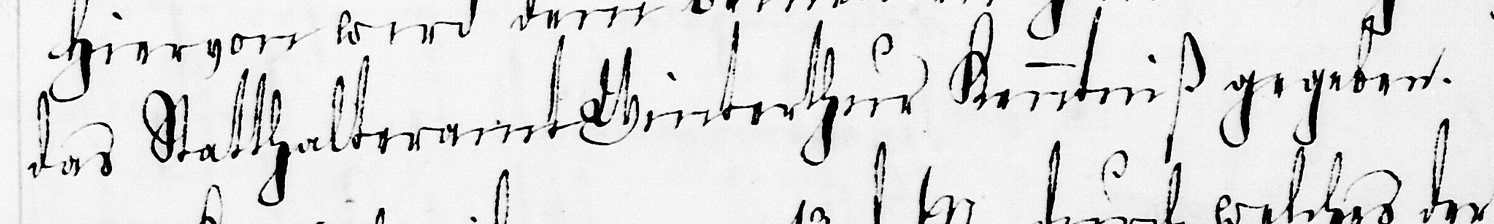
das Statthalteramt Winterthur Kenntniß gegeben.
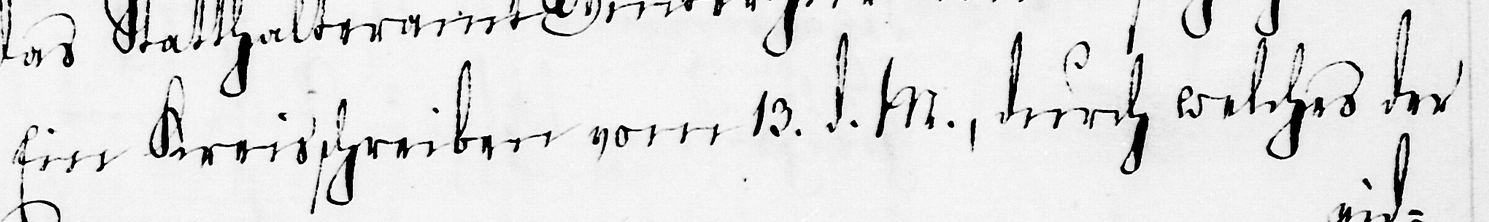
Ein Kreisschreiben vom 13. d. M., durch welches der
